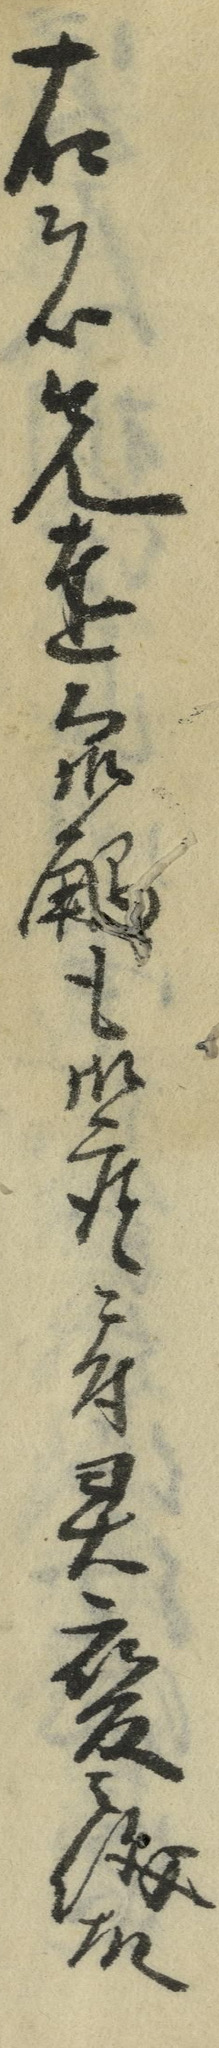右者先達而御触も御座候に付日異変之儀故
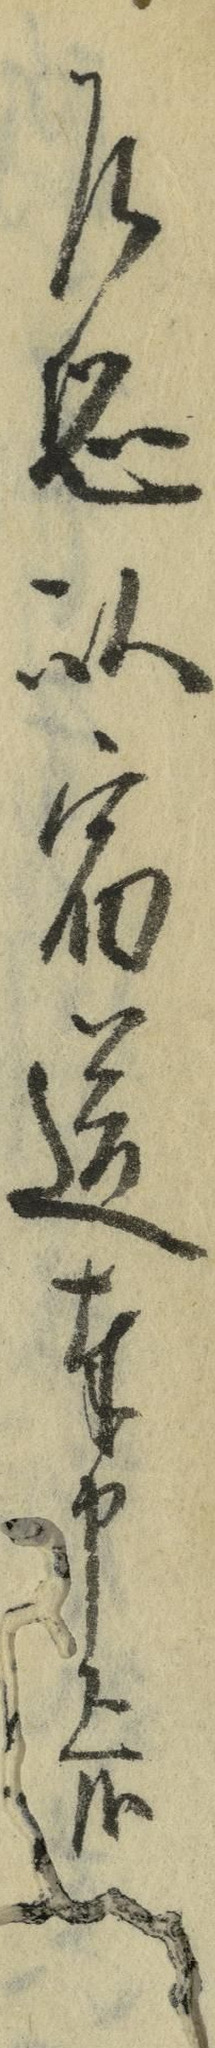乍恐以宿送奉申上候
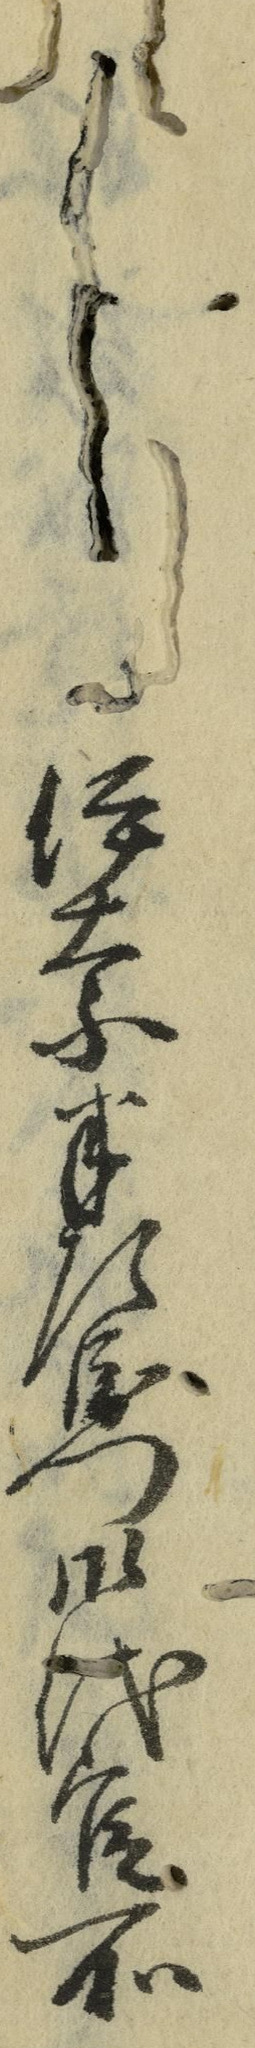伊奈半左衛門御代官所
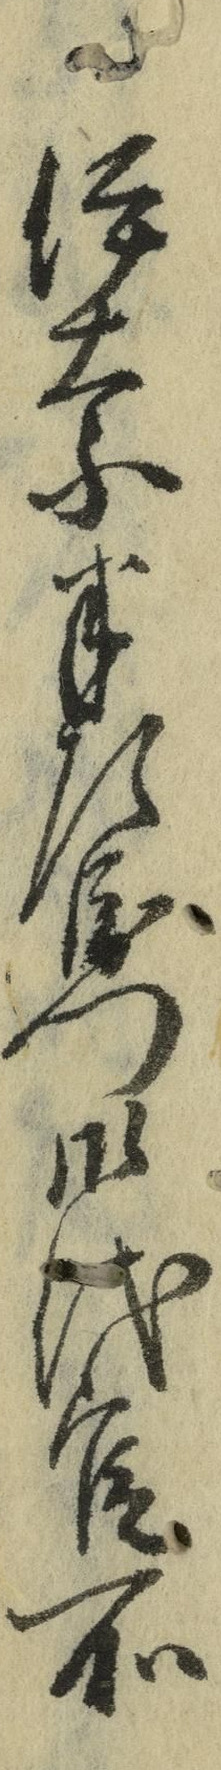伊奈半左衛門御代官所
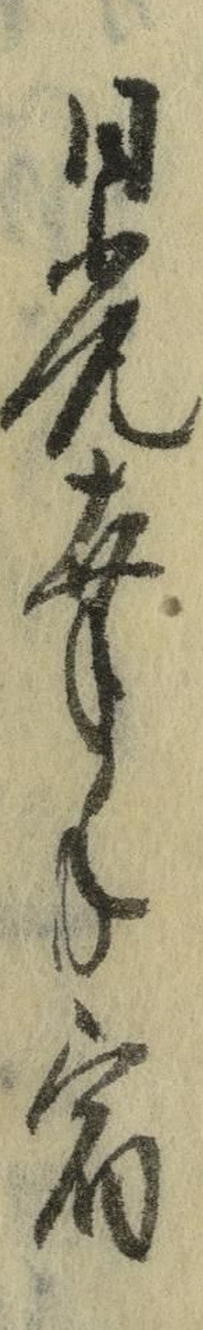日光幸手宿
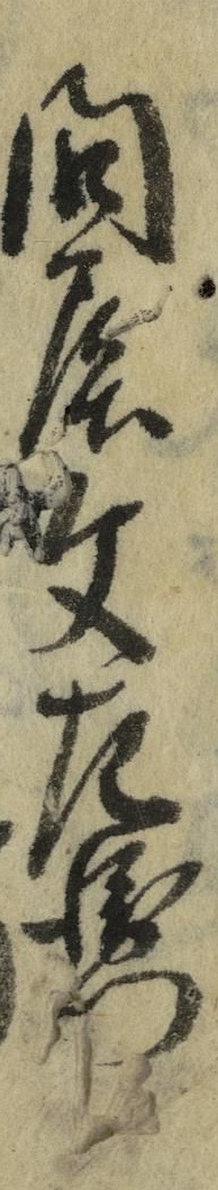問屋文左衛門
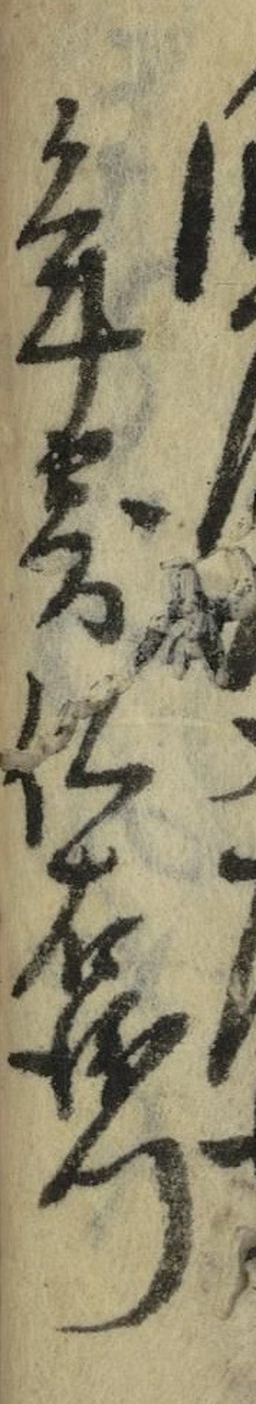年寄仁右衛門
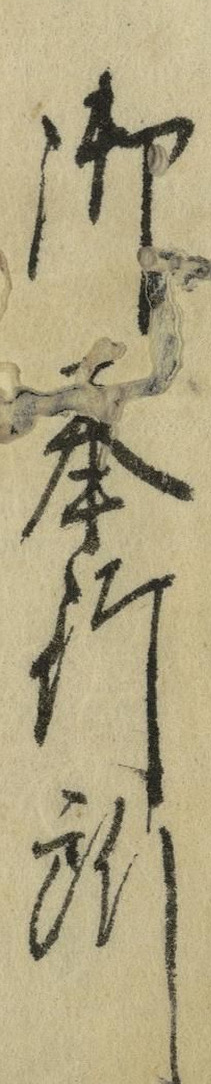御奉行所
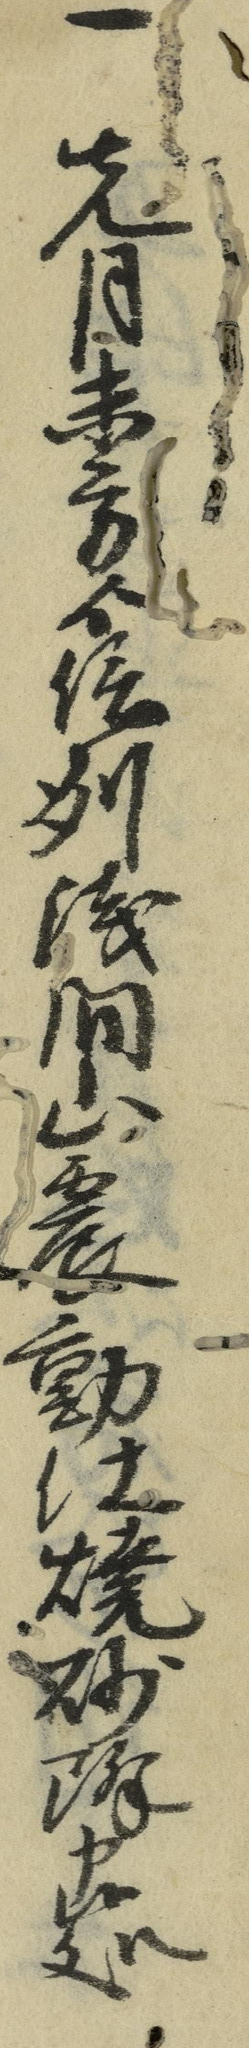一先月末方ゟ信州浅間山震動仕焼砂降申候処
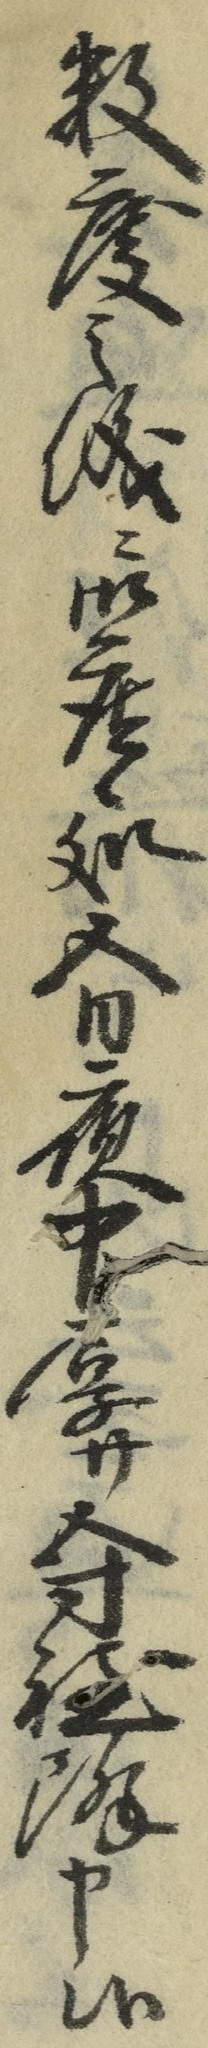数度之儀に御座候処五日夜中厚サ五寸程降申候
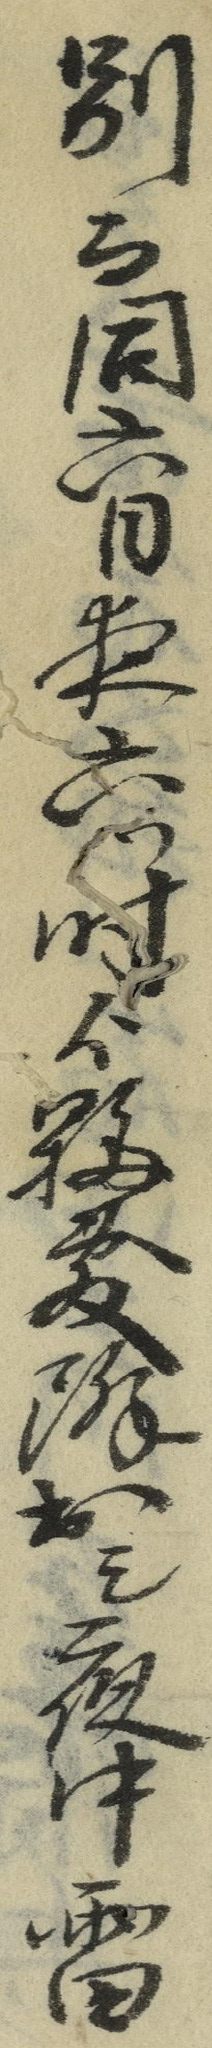別而同六日夜六ツ時ゟ夥敷降出シ夜中雷
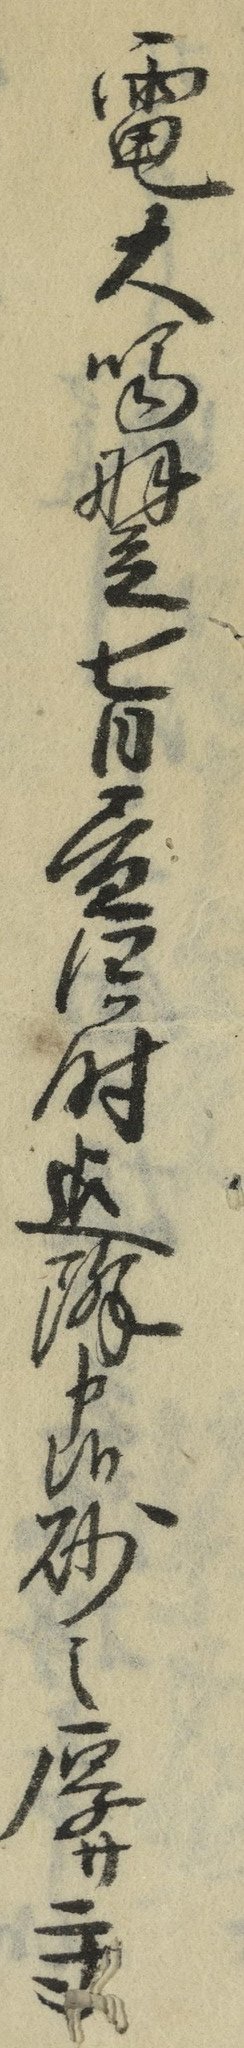電大鳴翌七日昼四ツ時迄降申候砂之厚サ二寸
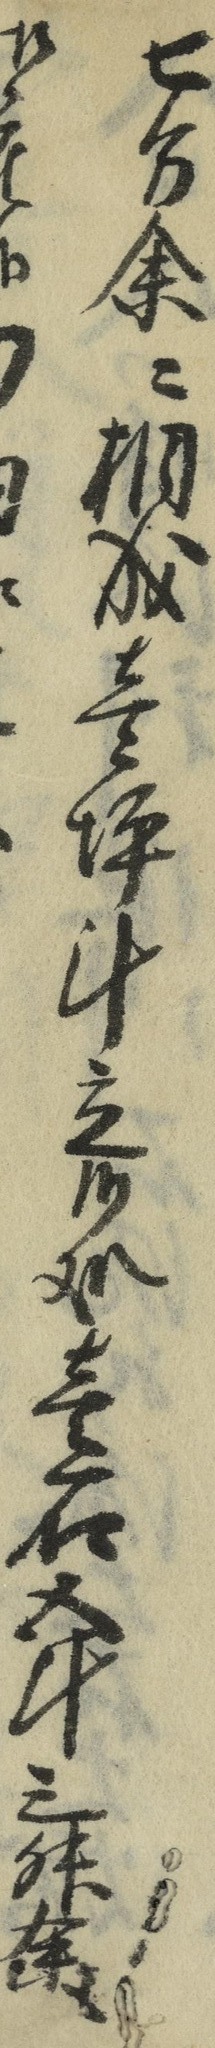七分余に相成壱坪計立候処壱石五斗三升余
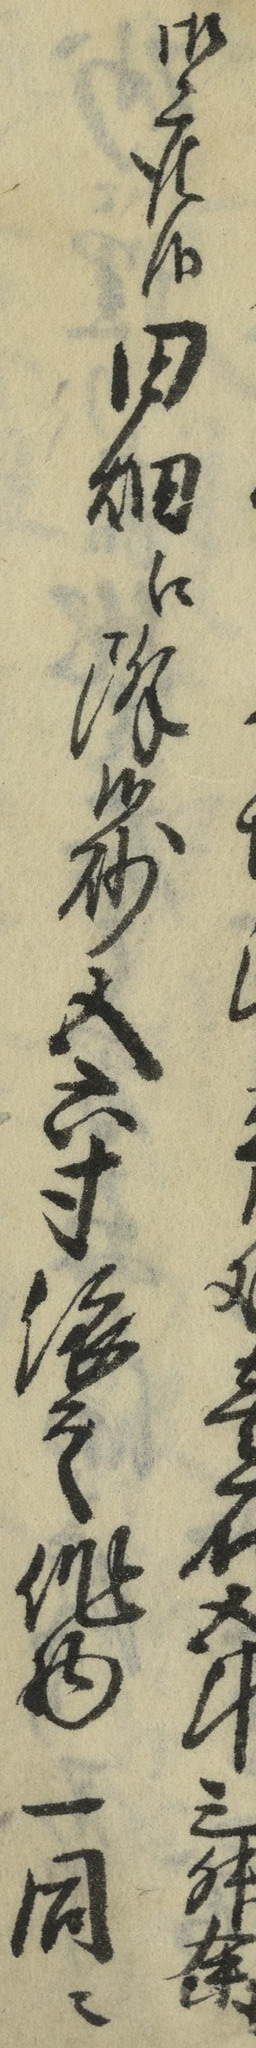御座候田畑江降候砂五六寸依之作物一同に

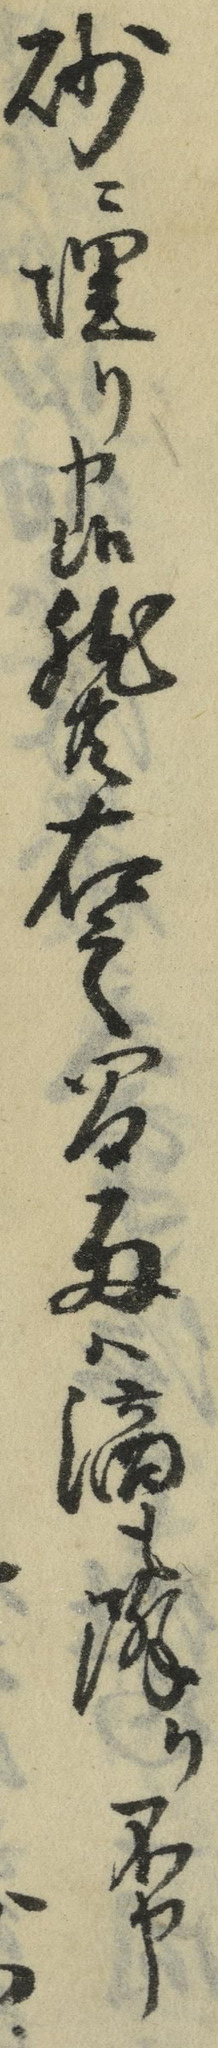砂に埋り申候然共右之間雨は滴も降り不申
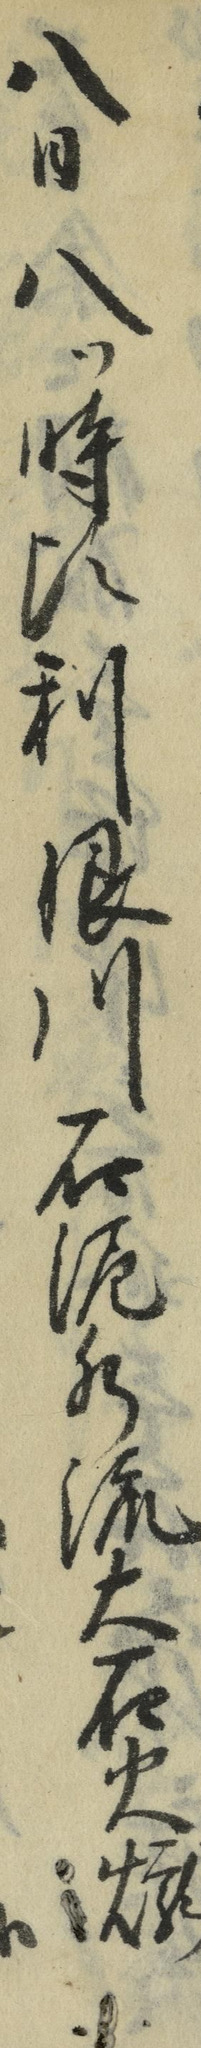八日八ツ時頃利根川石泥水流大石火燃
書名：天明三卯年七月　浅間山焼注進写
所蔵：東京大学地震研究所図書室 Earthquake Research Institute Library, The University of Tokyo, JAPAN
